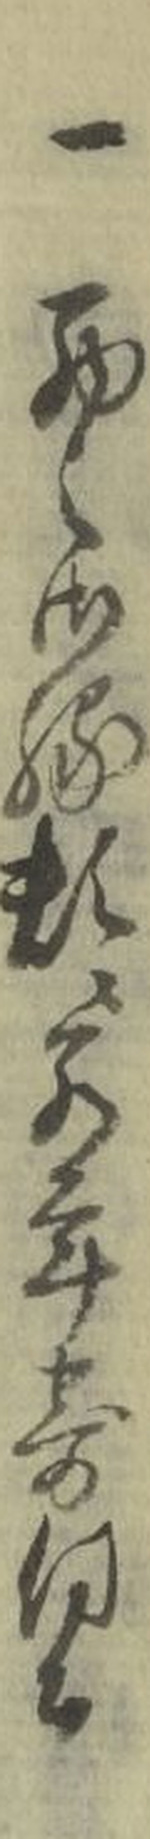一西之御縁頬に若年寄伺公
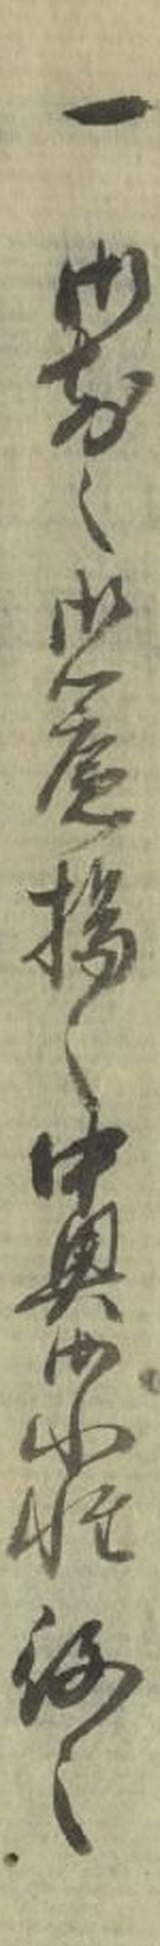一御前之御簾揚之中奥御小性役之
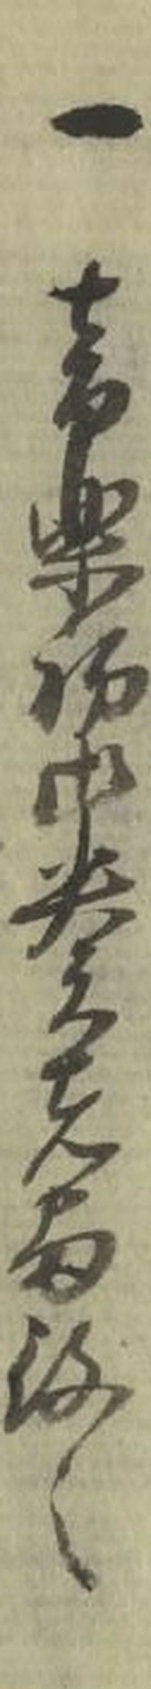一音楽御奏者番役之
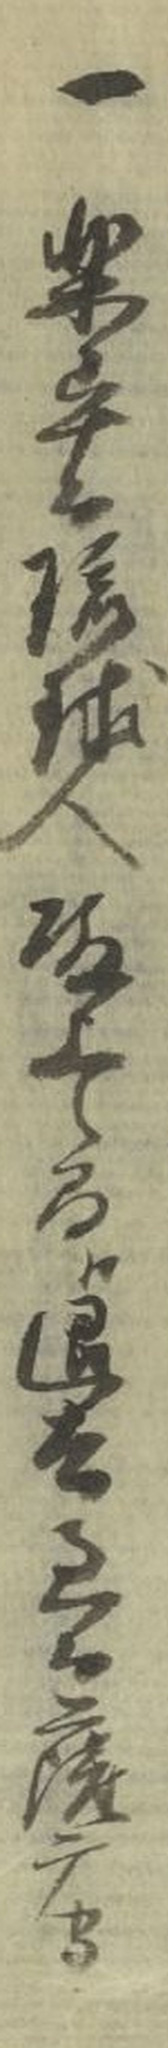一楽畢て琉球人殿上之間え退去過て薩摩守
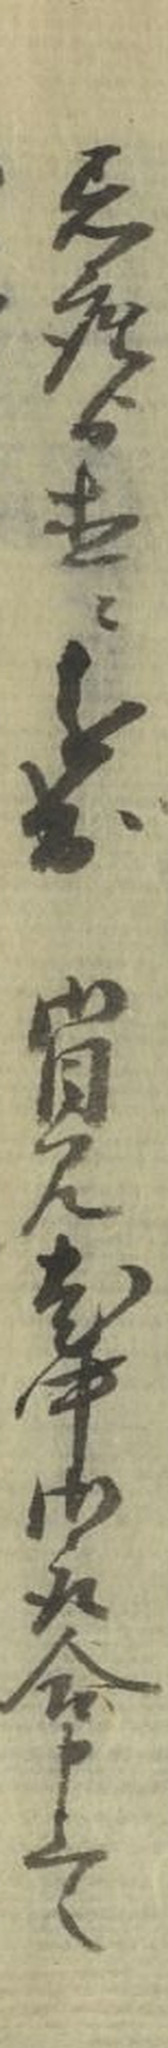着座ゟ直に進出御目見老中御取合申上之
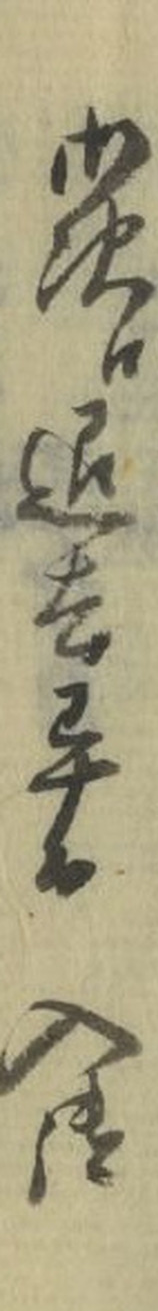御次え退去畢て入御
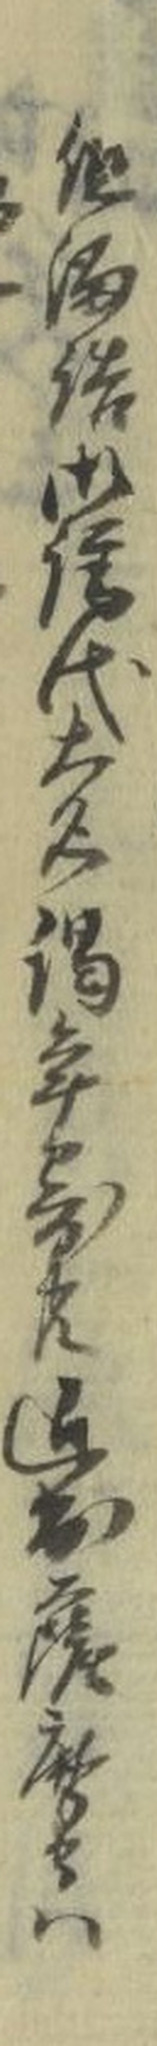但溜詰御譜代大名謁年寄共退出薩摩守は
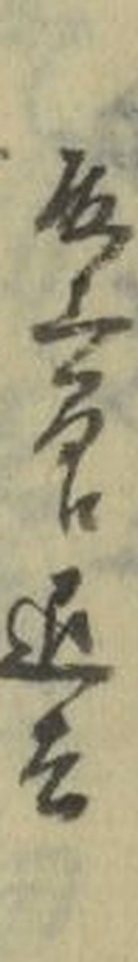殿上間え退去
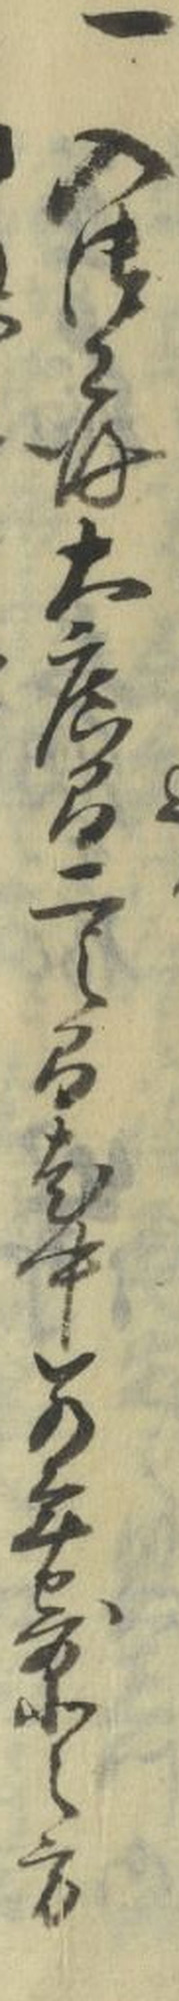一入御已後大広間二之間老中若年寄北之方
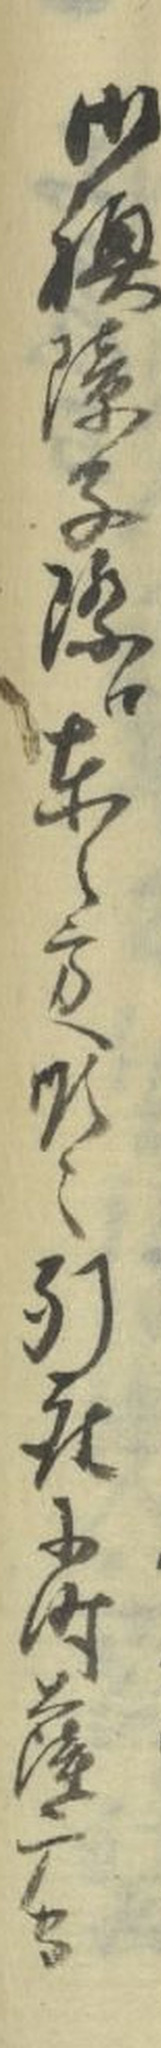御襖障子際え東之方へ順々列座于時薩摩守
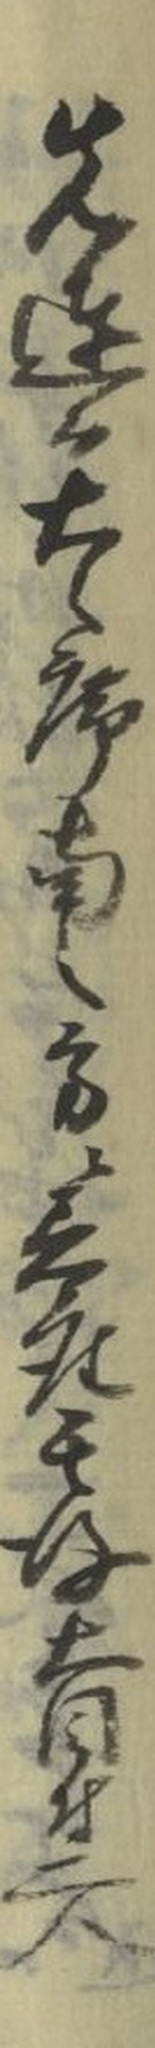先達て右之席南之方に着座其後大目付二人
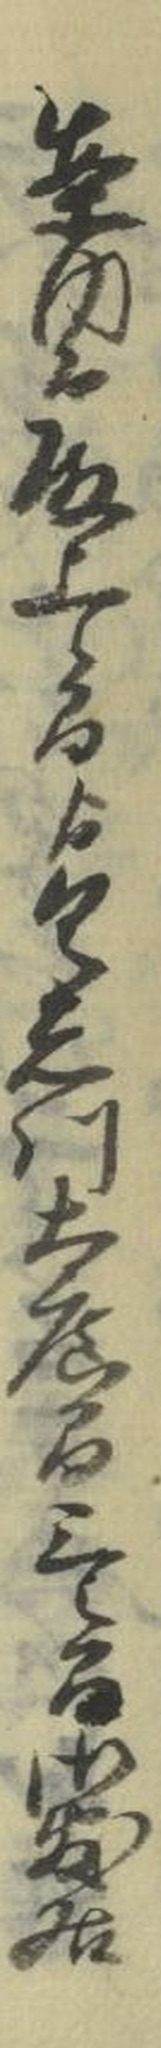案内而殿上之間ゟ具志川大広間三之間御敷居
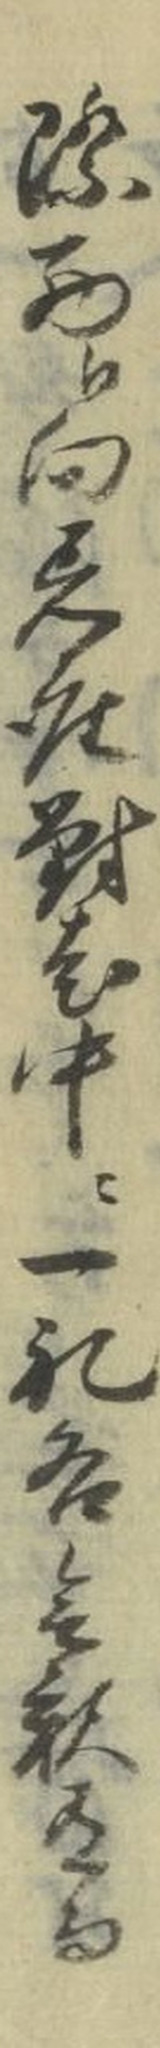際西え向着座対老中に一礼各会釈有て
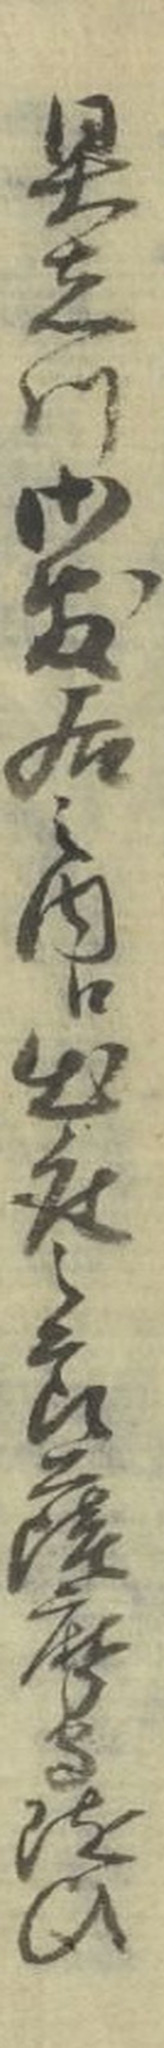具志川御敷居之内え出座之節薩摩守随ひ
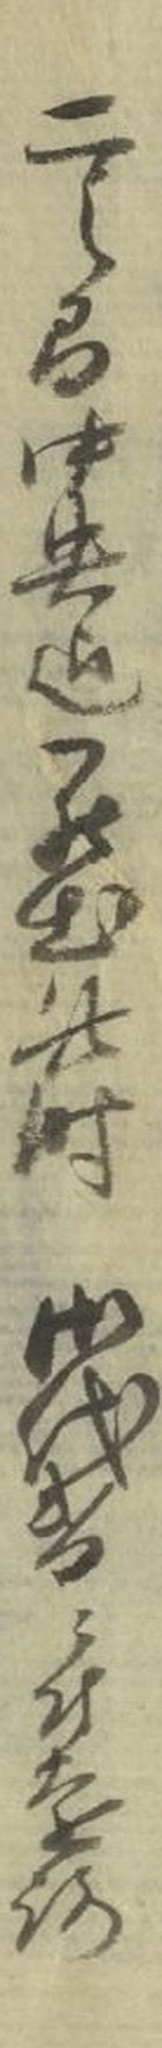二之間中央迄罷出此時御代替に付遠路
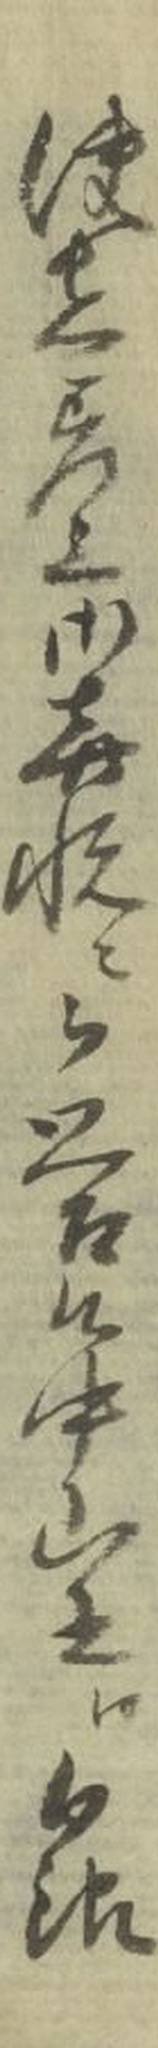使者差上御喜悦に被思召候中山王え白銀
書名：戊辰琉球人来朝之式 全
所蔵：University of the Ryukyus Library
